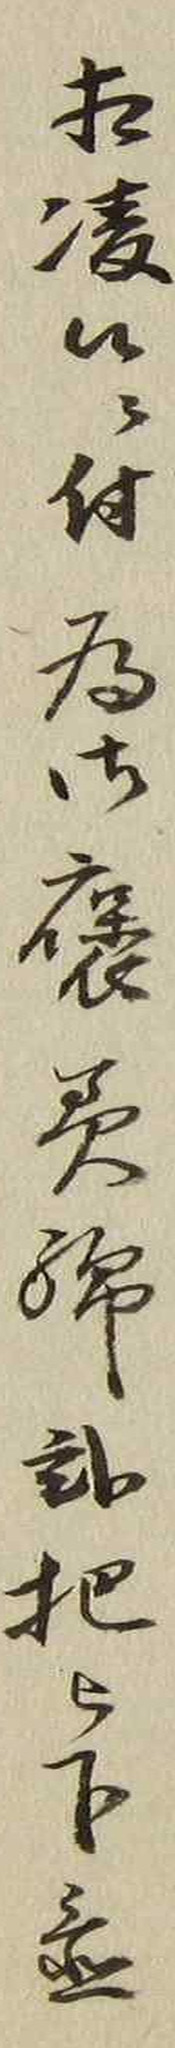相凌候ニ付為御褒美綿弐把被下置
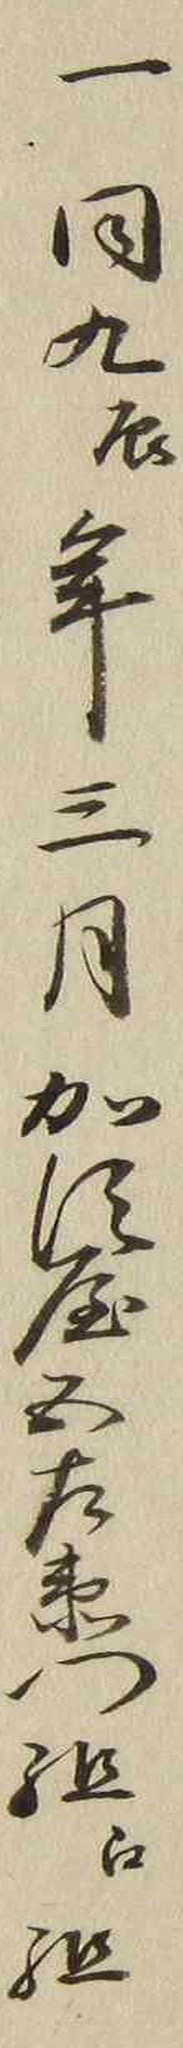一同九辰年三月加須屋五左衛門組江組
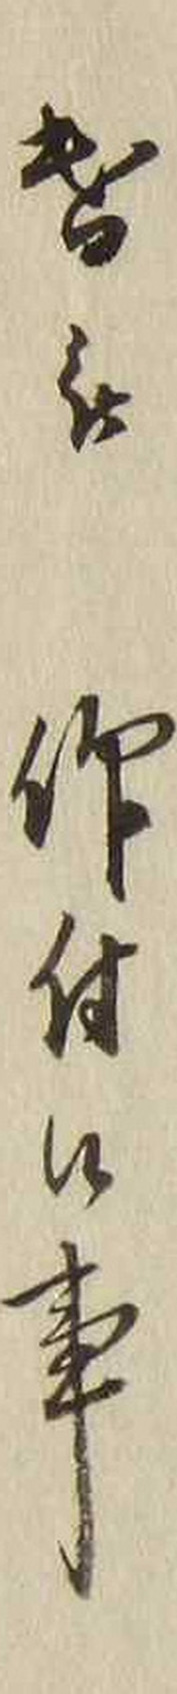替被仰付候事

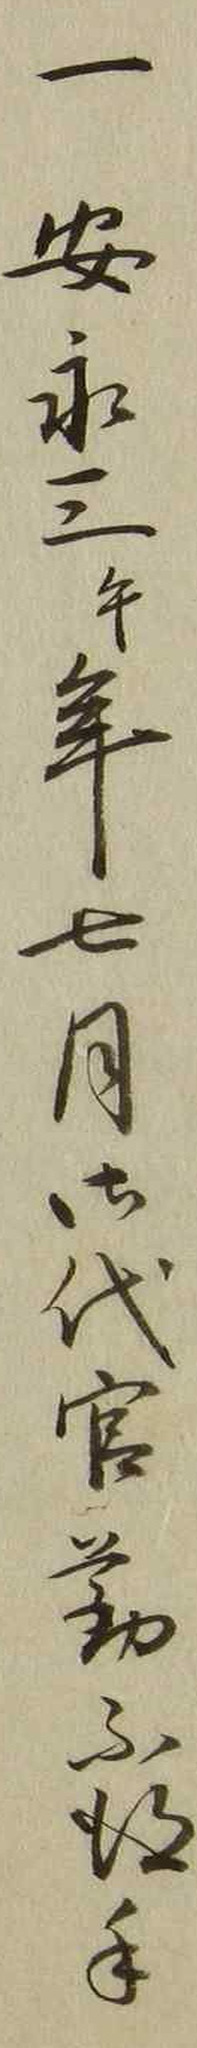一安永三午年七月御代官勤不得手
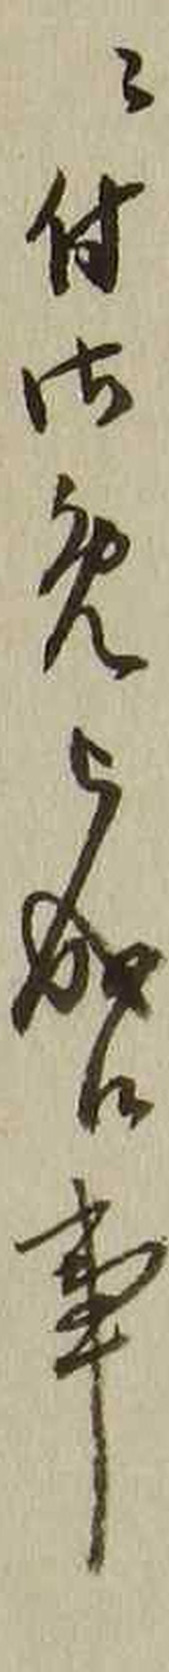ニ付御免被成候事
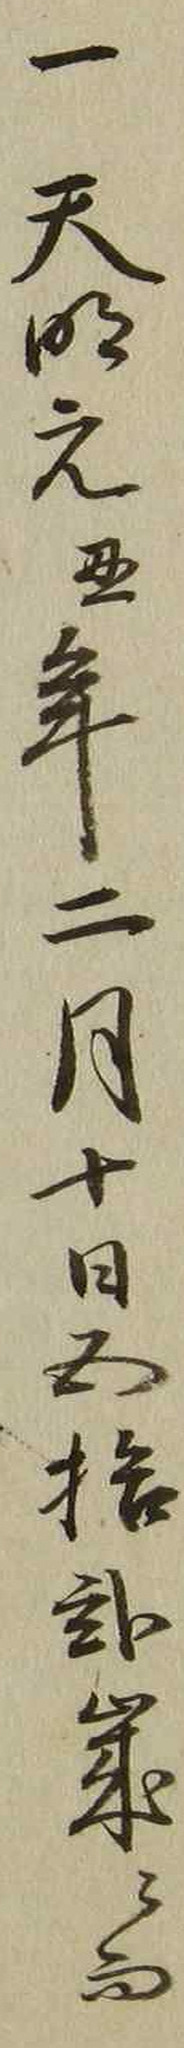一天明元丑年二月十日五拾弐歳ニ而
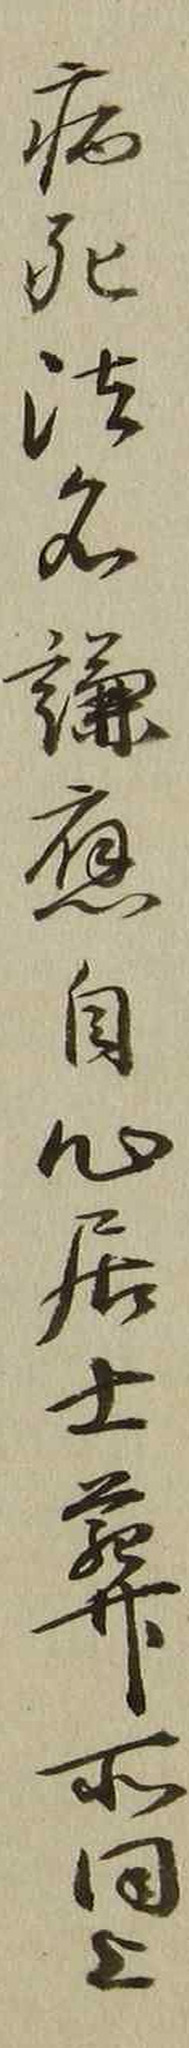病死法名謙応自心居士葬所同上
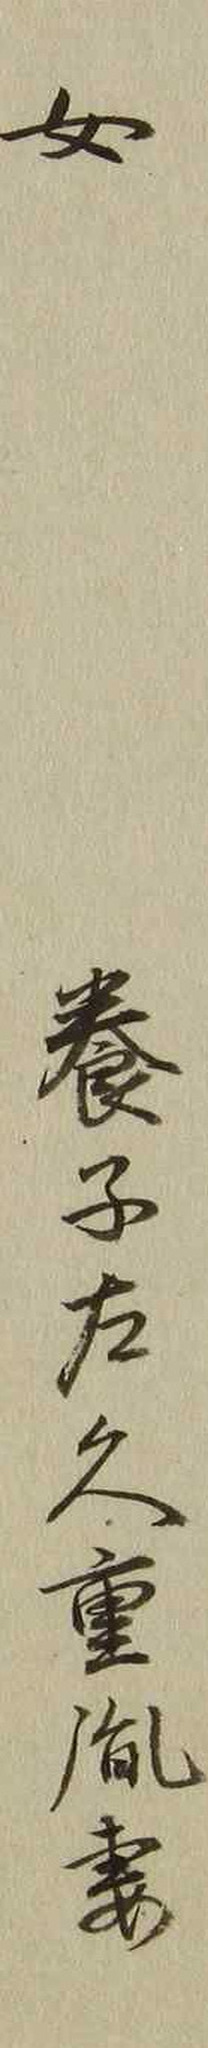女養子左久重胤妻
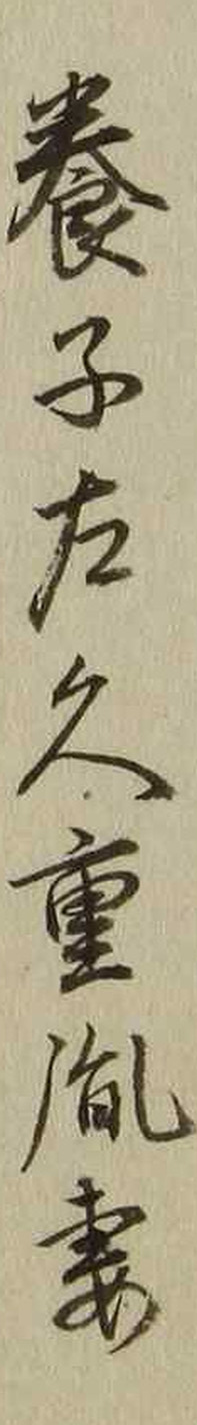女養子左久重胤妻
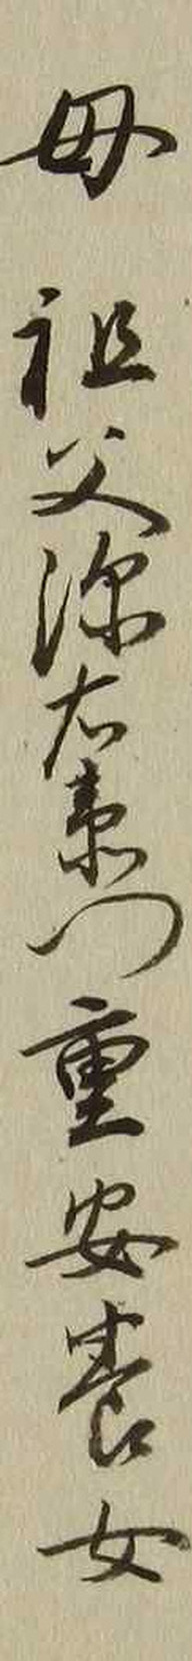母祖父源右衛門重安養女
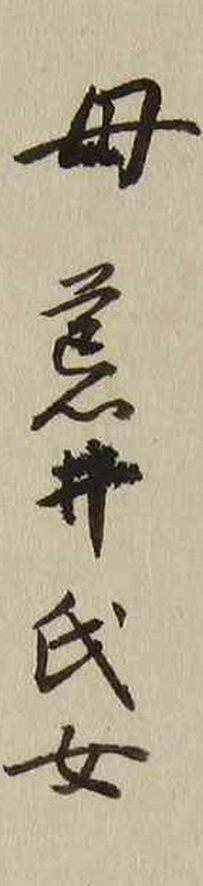母荒井氏女
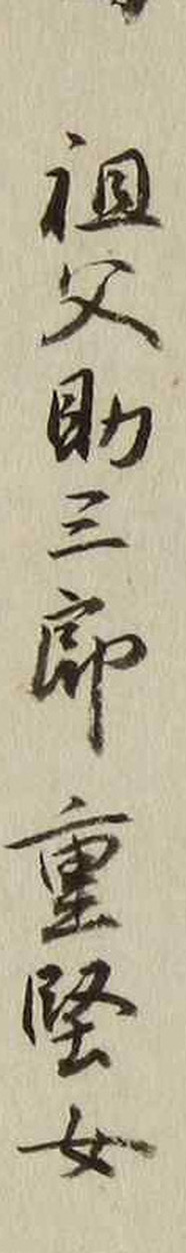母祖父助三郎重堅女
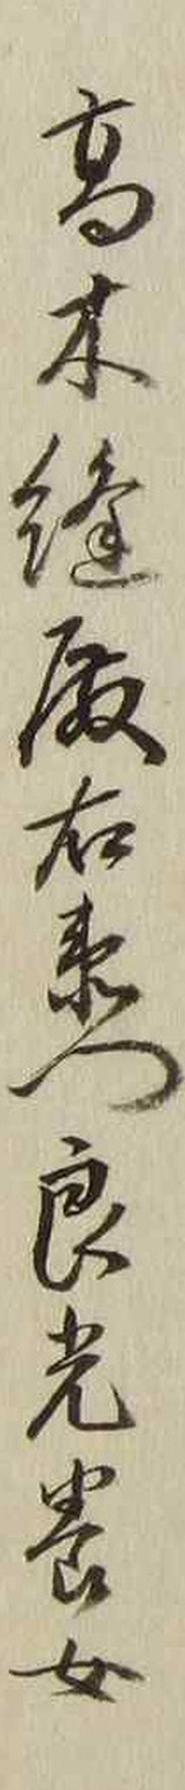女高木縫殿右衛門良光養女
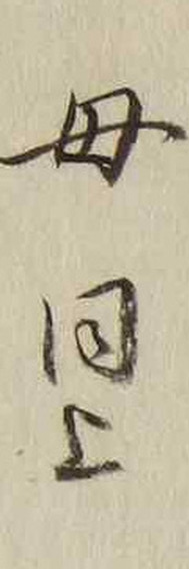母同上

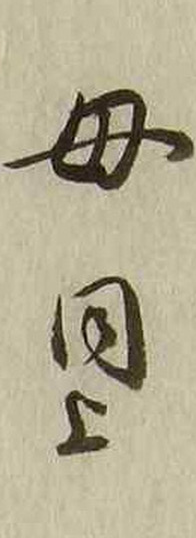母同上
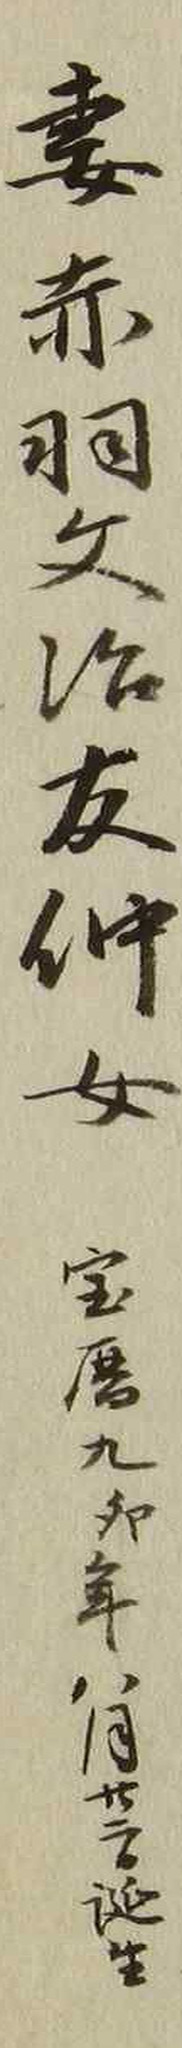妻赤羽文治友仲女宝暦九卯年八月廿二日誕生
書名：諸士系譜　巻之128　た之部4
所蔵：会津若松市立会津図書館
